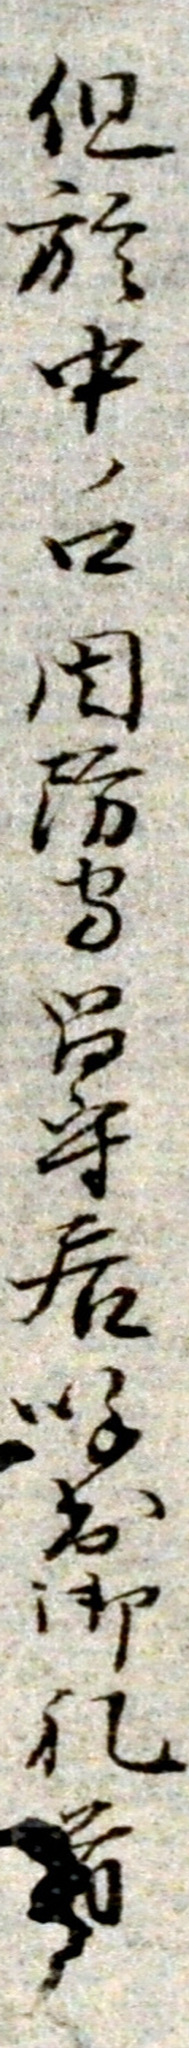但於中ノ口周防守留守居呼出御礼首
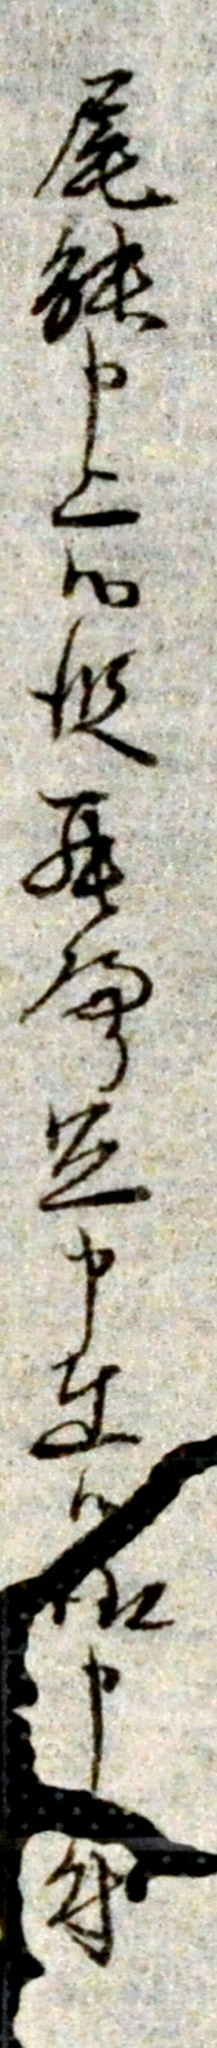尾能申上候段罷帰り宜申達候様申付
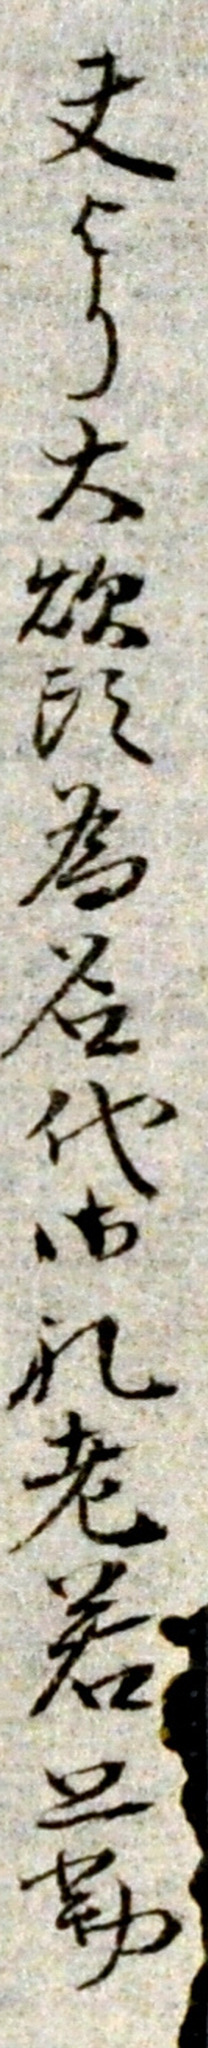夫より大炊頭為名代御礼老若廻勤
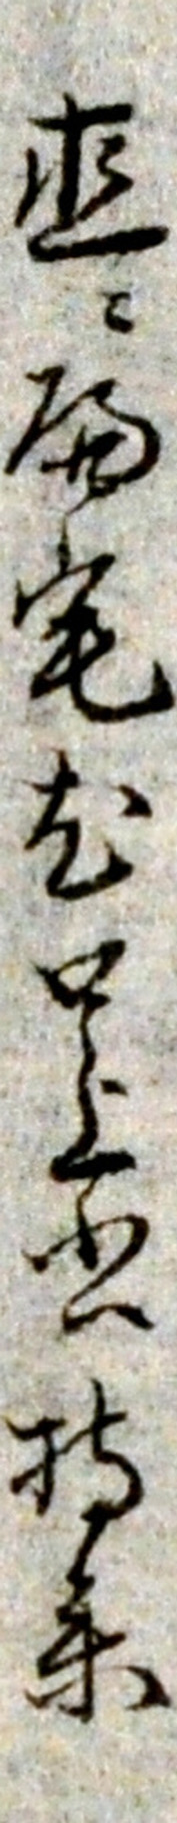直ニ帰宅尤口上書持参

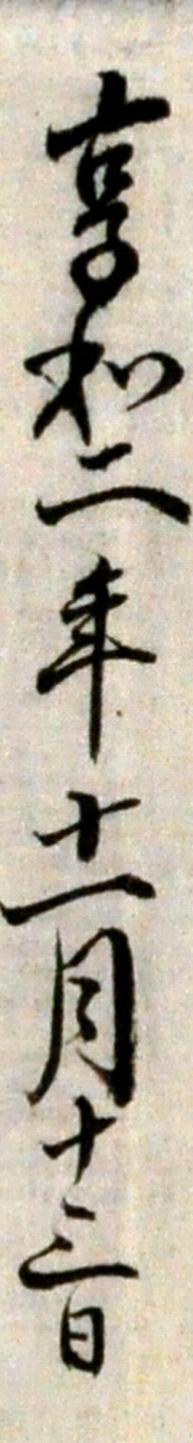享和二年十一月十三日
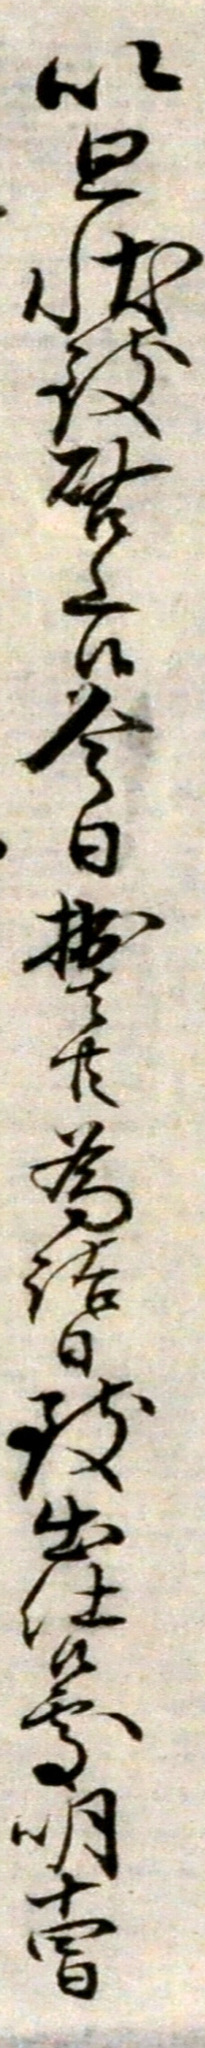以廻状致啓上候今日拙者共為詰日致出仕候處明十四日
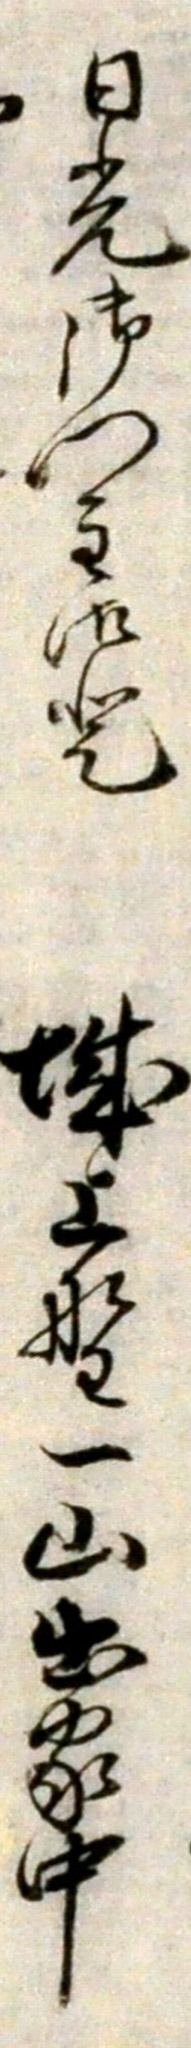日光御門主御登城上野一山出家中
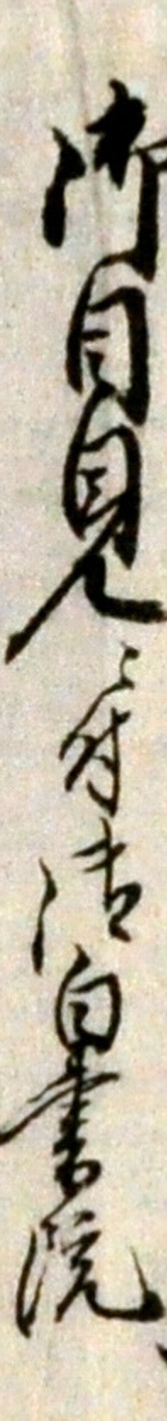御目見ニ付御白書院
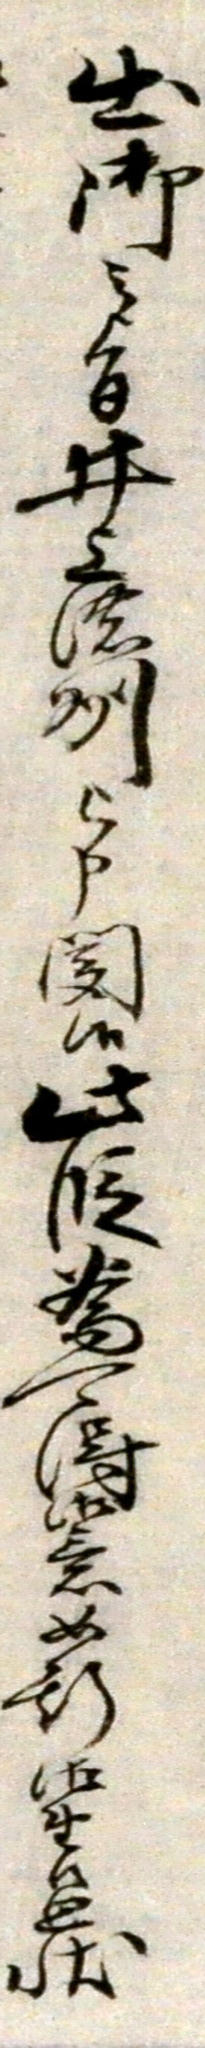出御之旨井上濃州被申聞候此段為可得御意如斯御座候廻状
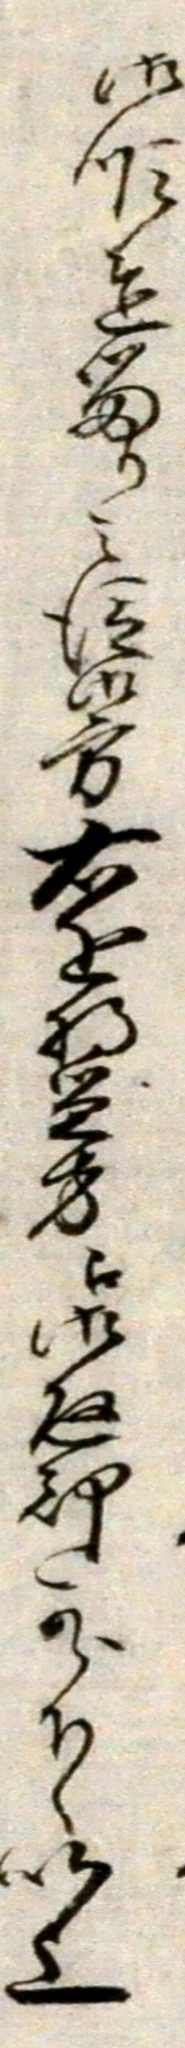御順達留り之後御方右近将監方え御返却可被下候以上
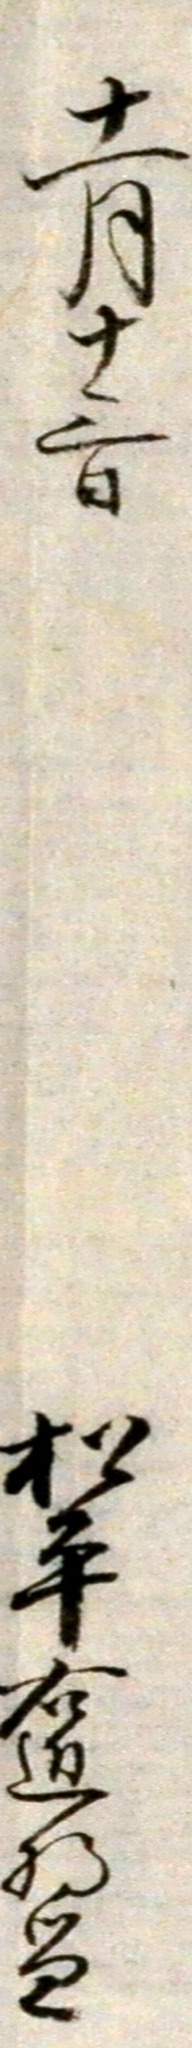十一月十三日松平右近将監
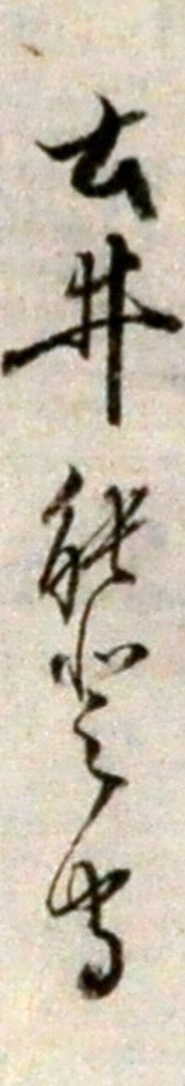土井能登守
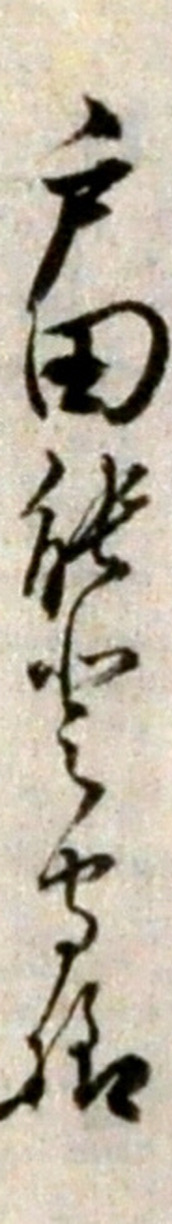戸田能登守様
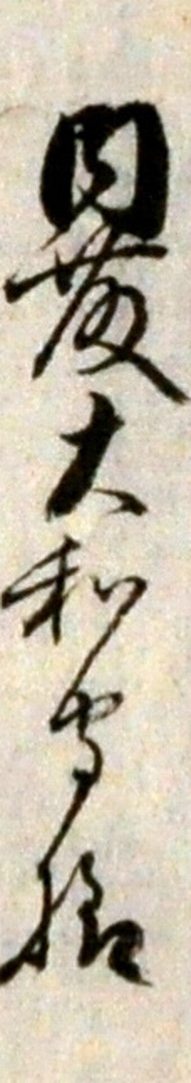内藤大和守様
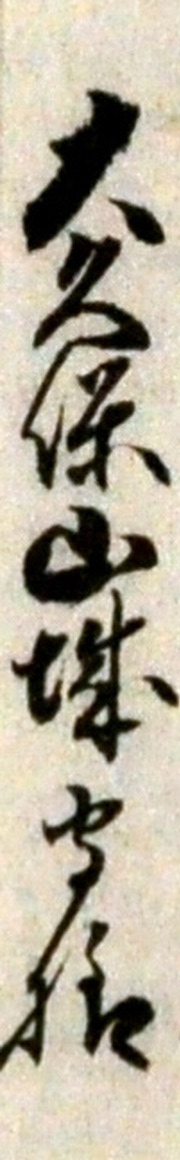大久保山城守様
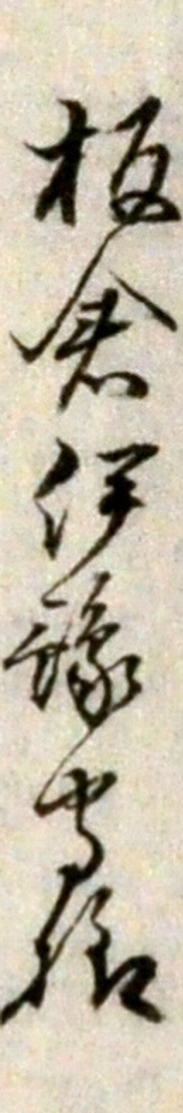板倉伊豫守様
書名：諸名代相勤候節ノ留書外
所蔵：伊那市立高遠町図書館・合同会社AMANE
